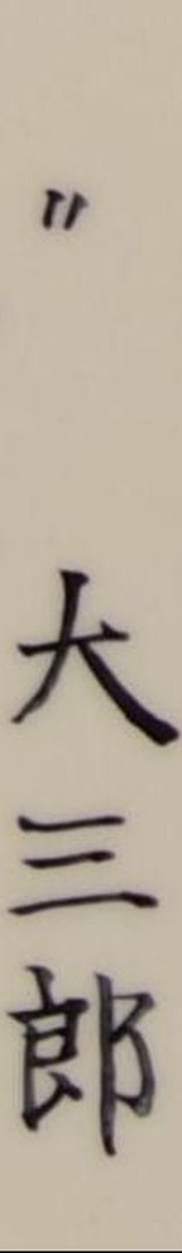大三郎
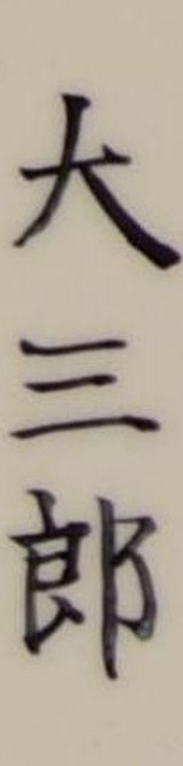大三郎
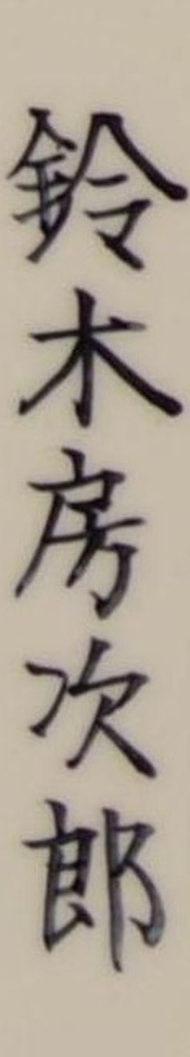鈴木房次郎
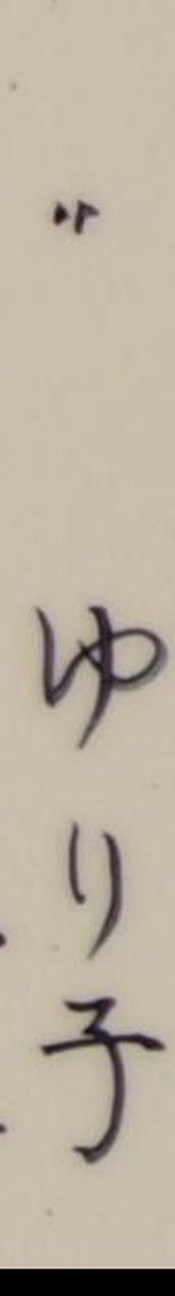ゆり子
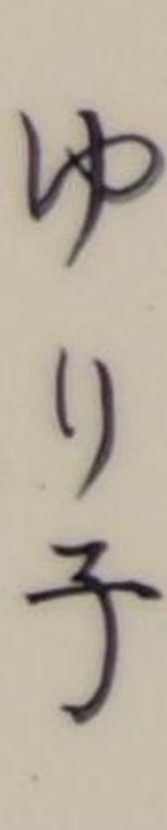ゆり子

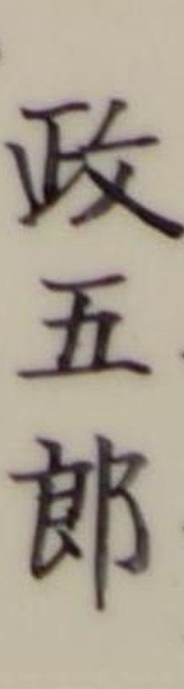政五郎
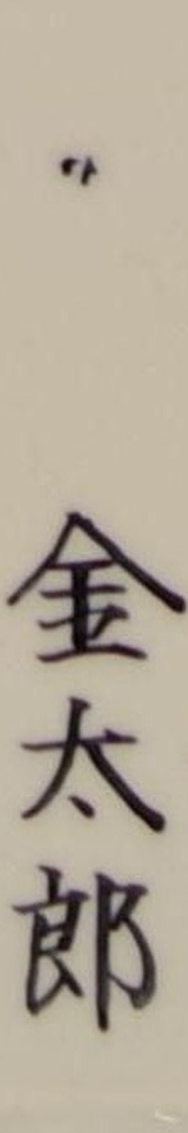金太郎
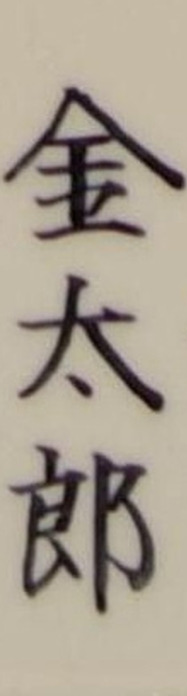金太郎
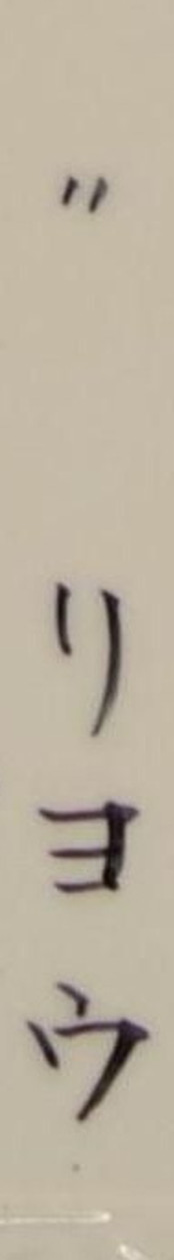リヨウ
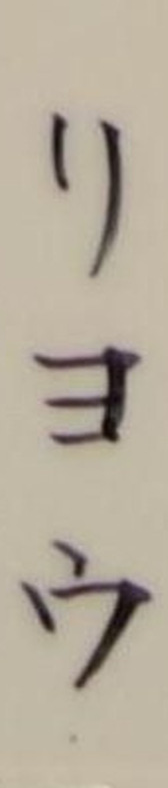リヨウ
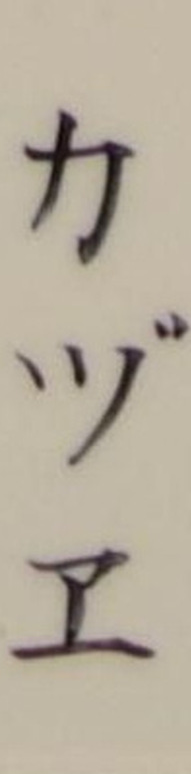カヅエ
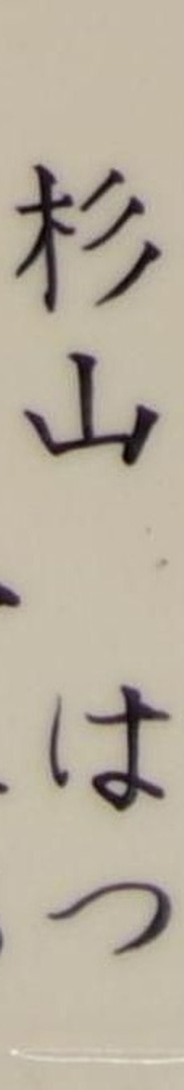杉山はつ
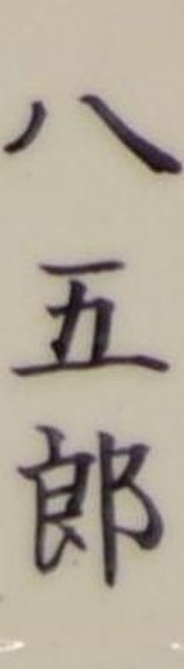八五郎
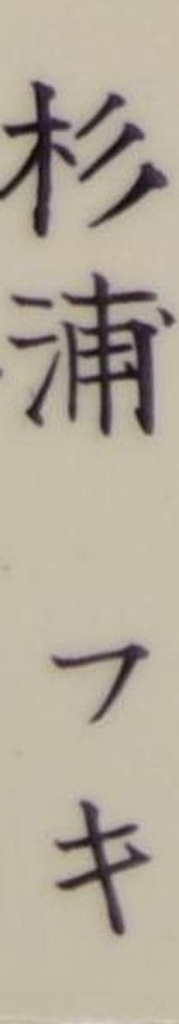杉浦フキ
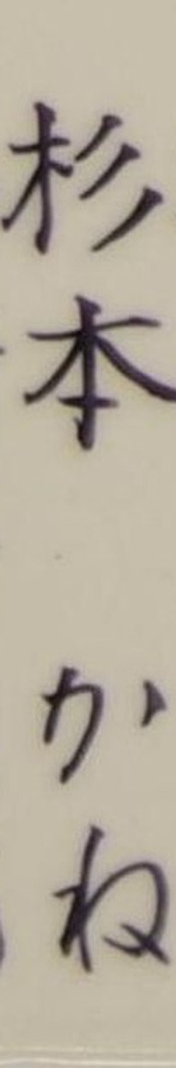杉本かね
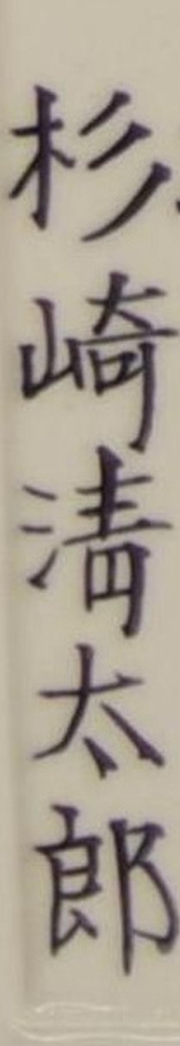杉崎清太郎
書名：M~S
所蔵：高野山金剛峯寺
